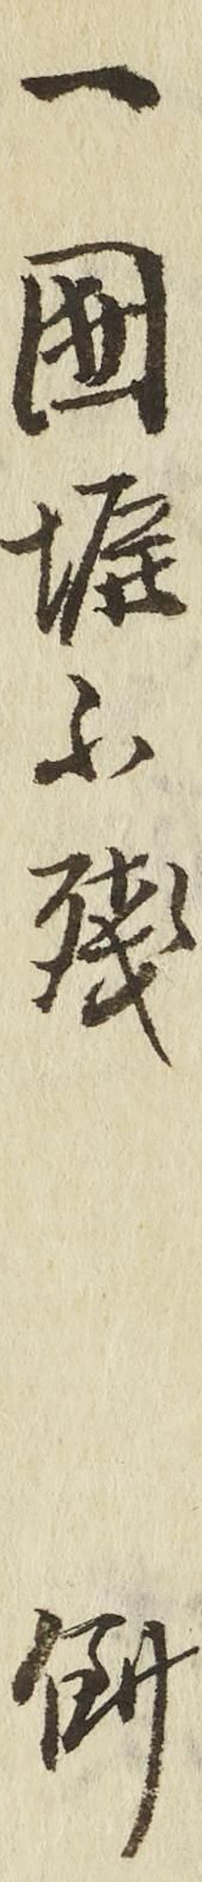一囲塀不残倒
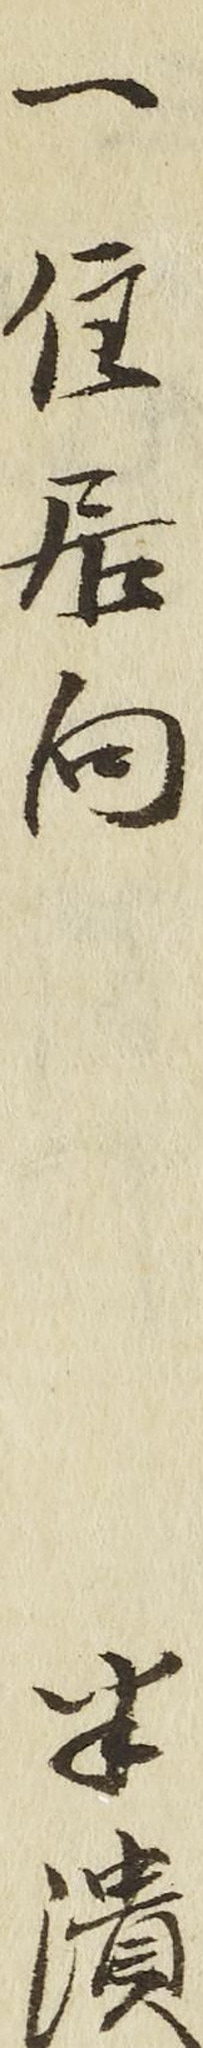一住居向半潰
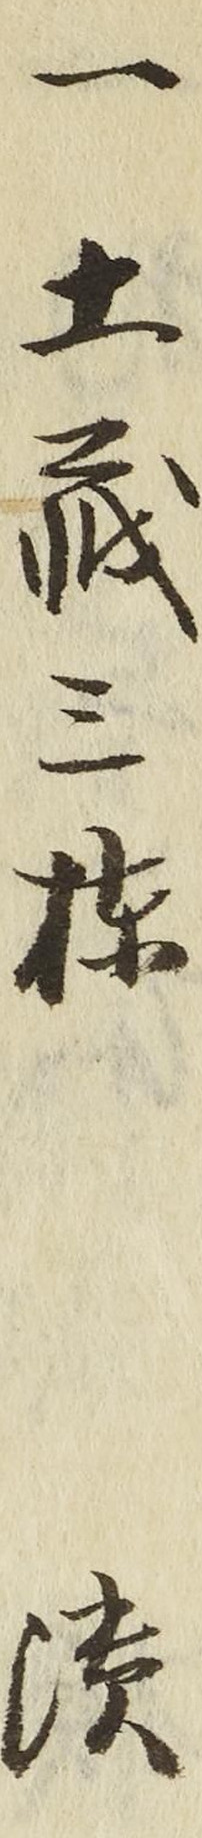一土蔵三棟潰
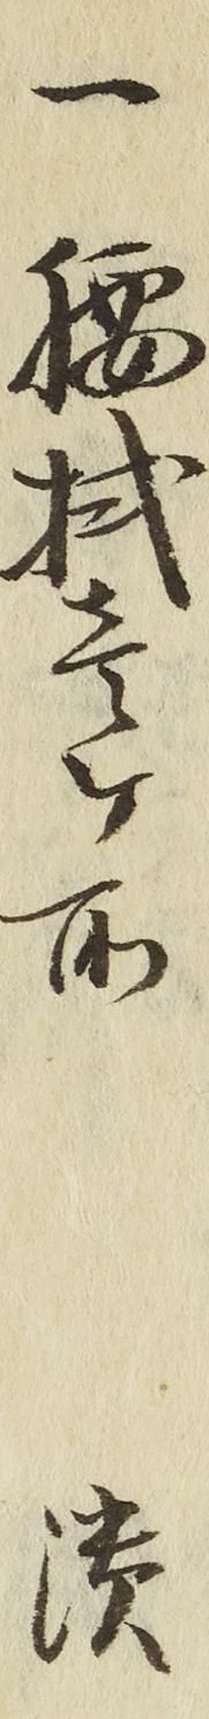一腰掛壱ヶ所潰
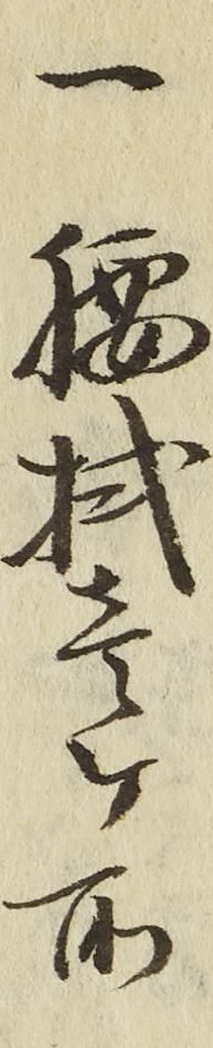一腰掛壱ヶ所潰
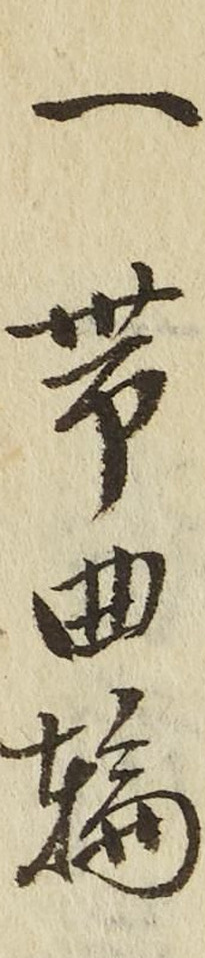一帯曲輪
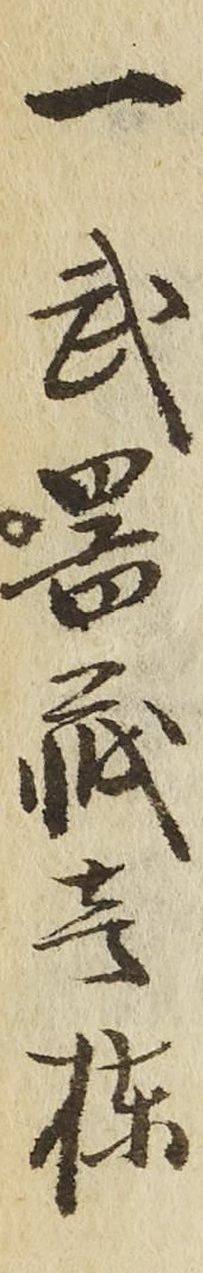一武器蔵壱棟損
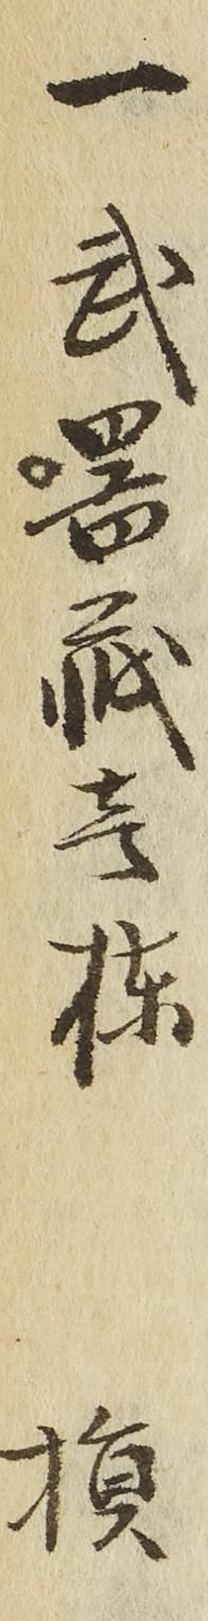一武器蔵壱棟損

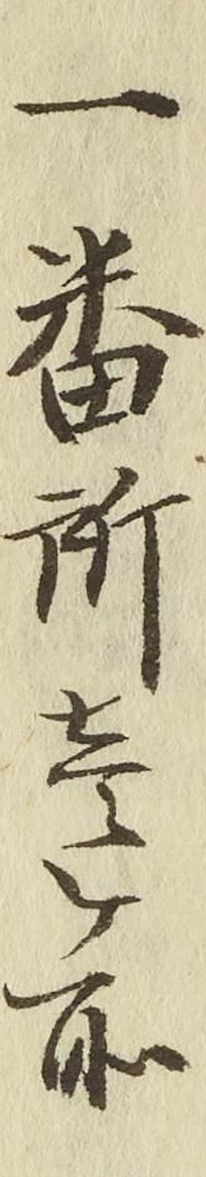一番所壱ヶ所損
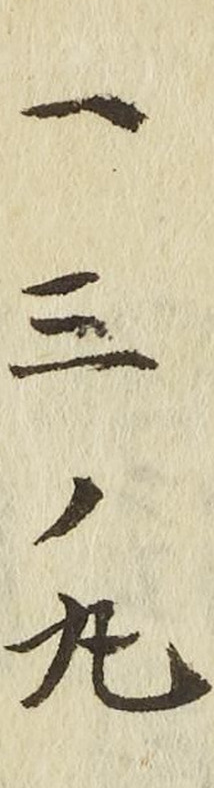一三ノ丸
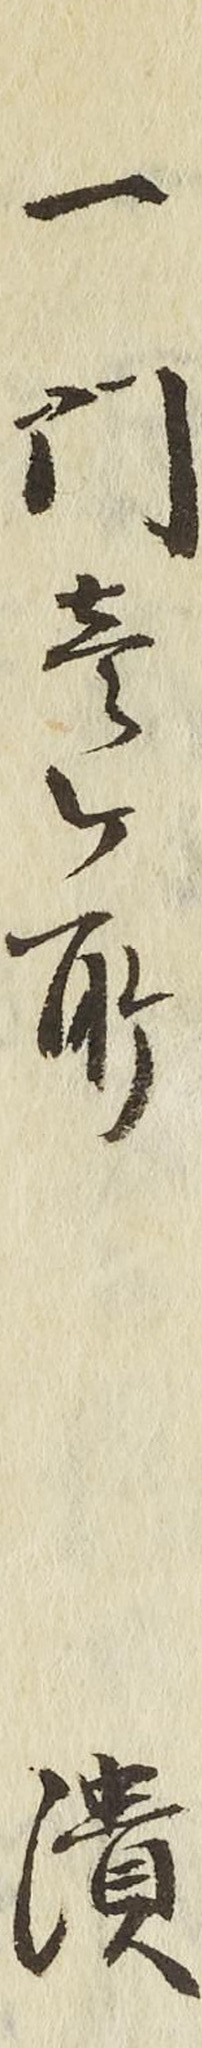一門壱ヶ所潰
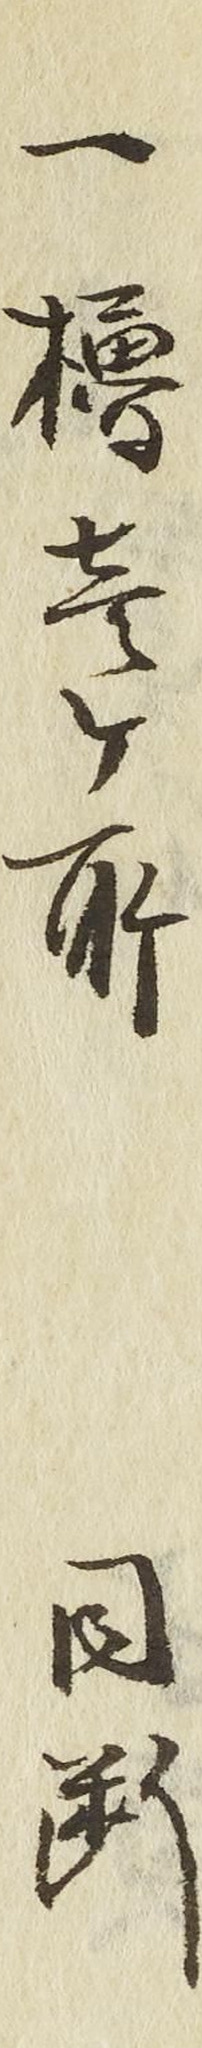一櫓壱ヶ所同断
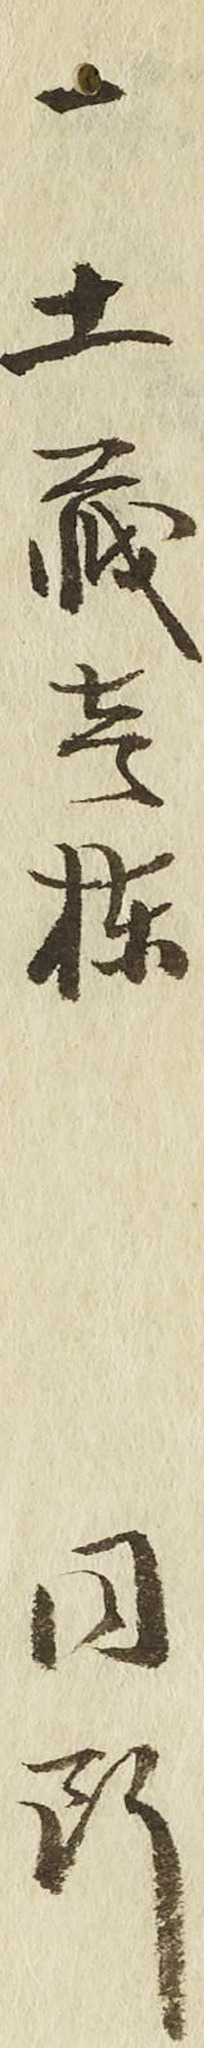一土蔵壱棟同断
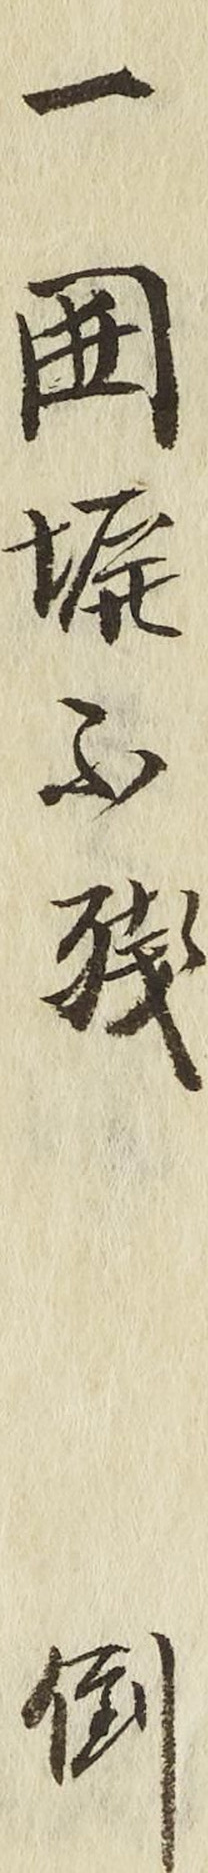一囲塀不残倒
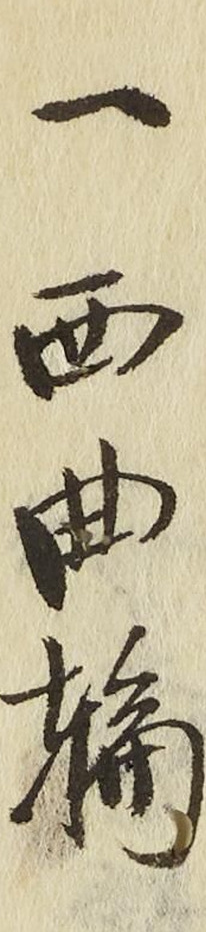一西曲輪
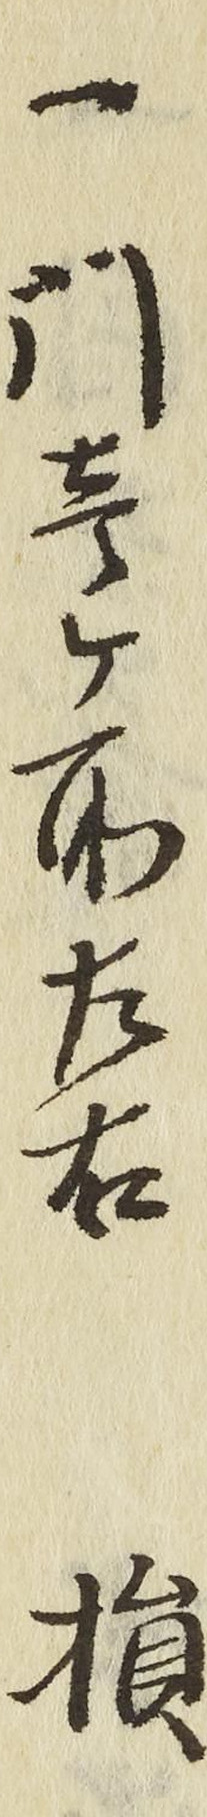一門壱ヶ所左右損
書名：信濃國大地震記　乾
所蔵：東京大学地震研究所図書室 Earthquake Research Institute Library, The University of Tokyo, JAPAN
